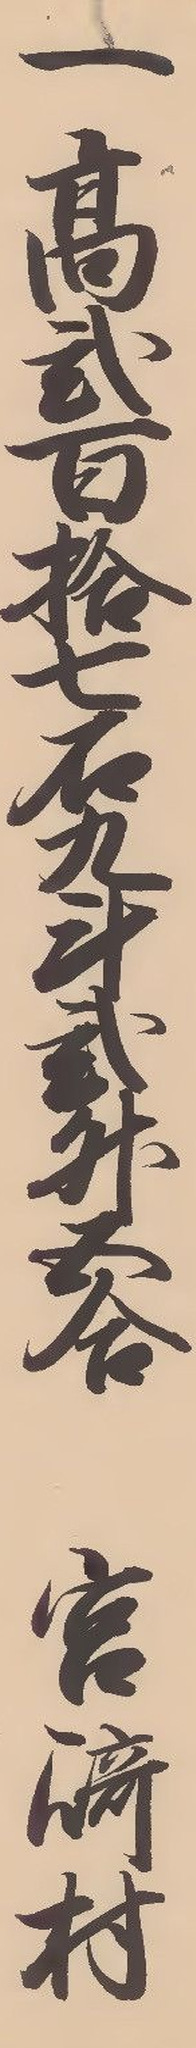一高弐百拾七石九斗弐升五合宮崎村
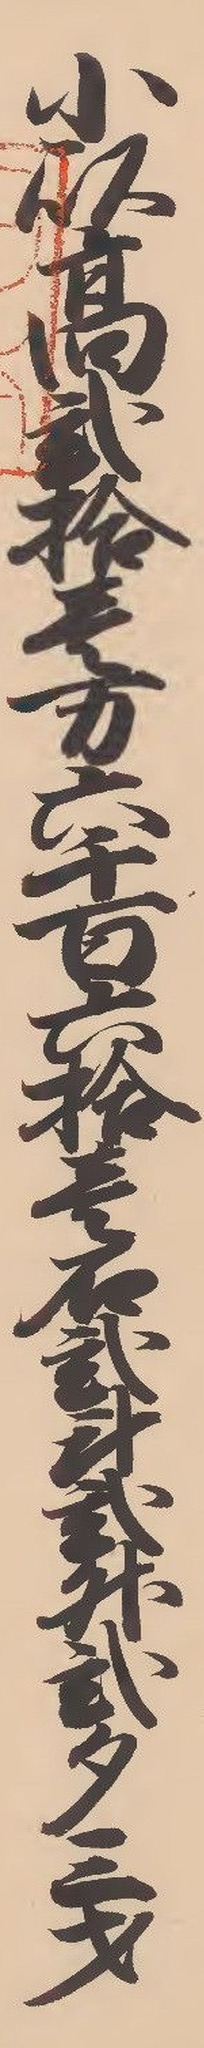小以弐拾壱万六千百六拾壱石弐斗弐升弐勺三才
